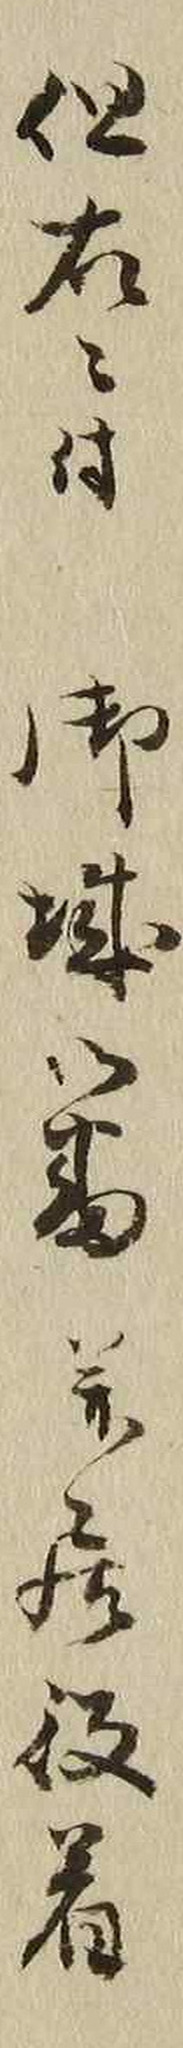但右ニ付御城御番并居役着
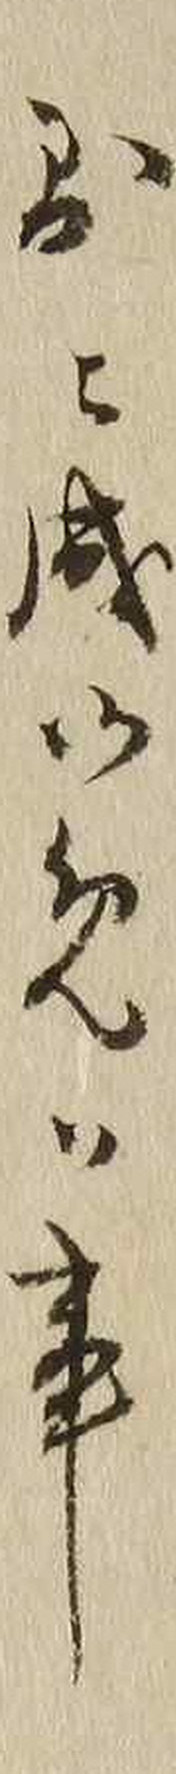到被成御免候事
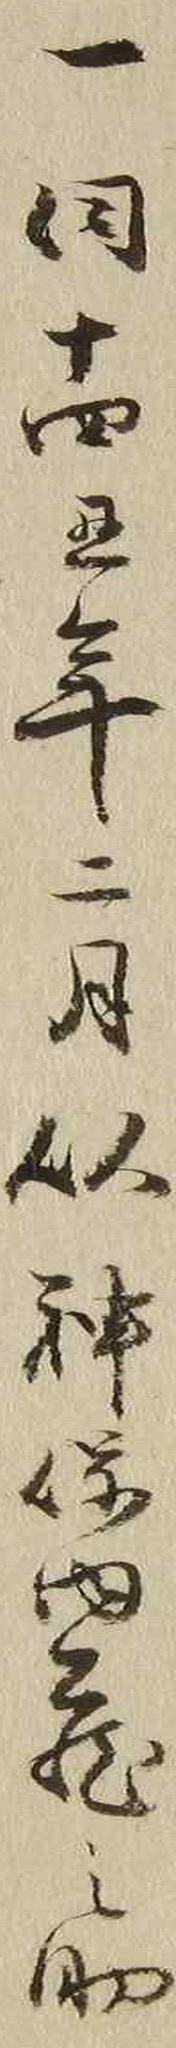一同十四丑年二月頭神保内蔵之助
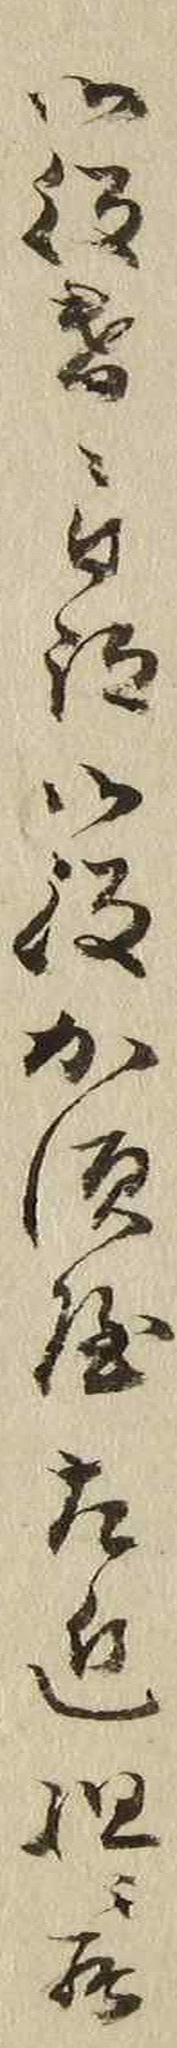御役替ニ付跡御役加須屋左近組ニ罷
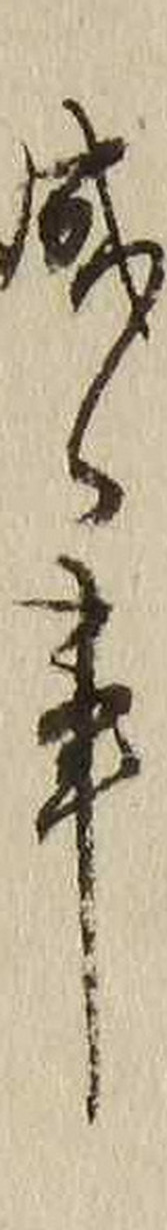成候事
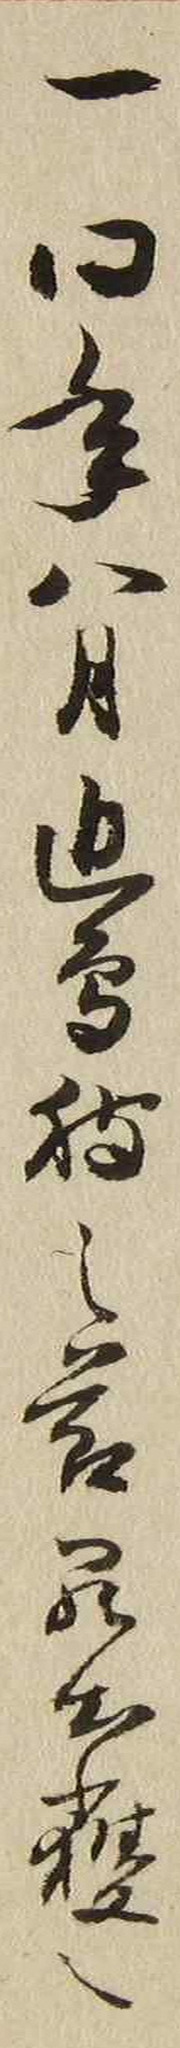一同年八月追鳥狩之節罷出獲之
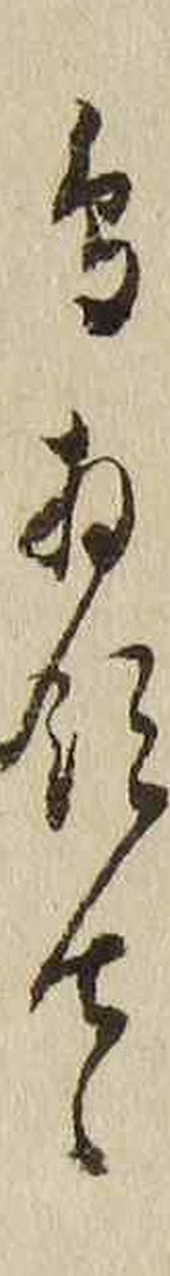鳥拝領仕候
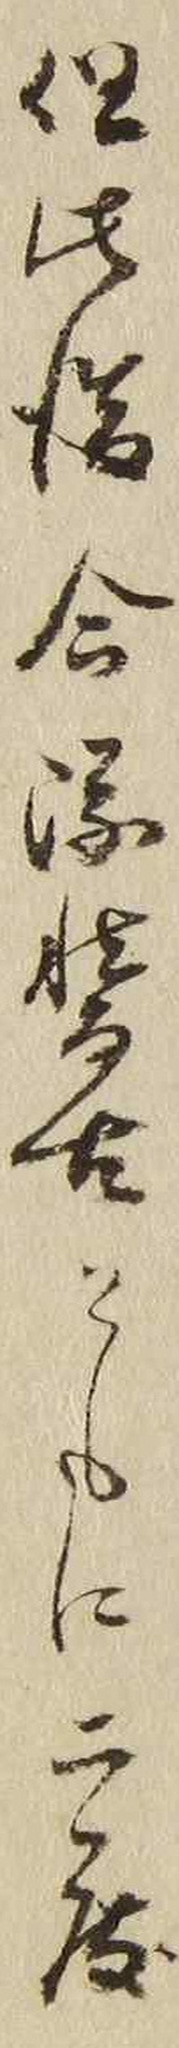但此後合隊稽古ともに二度
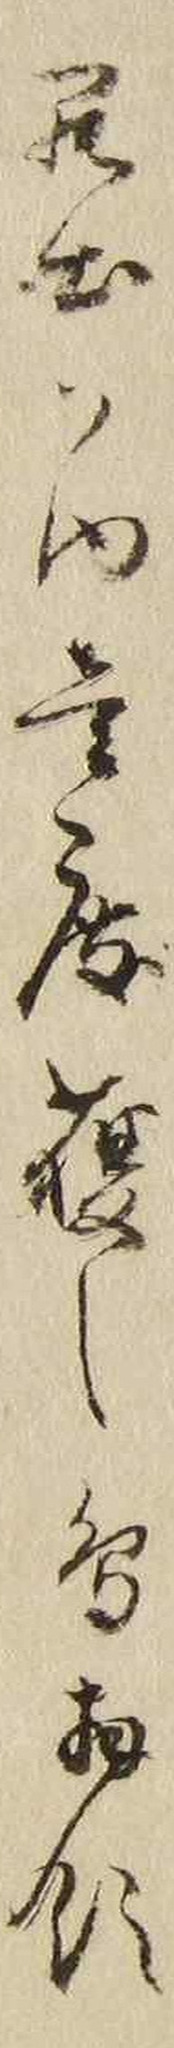罷出候内其度獲之鳥拝領
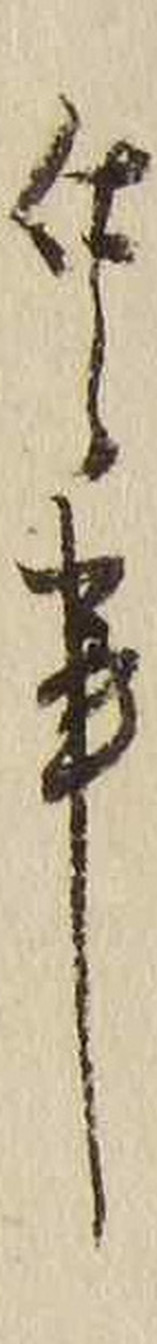仕候事

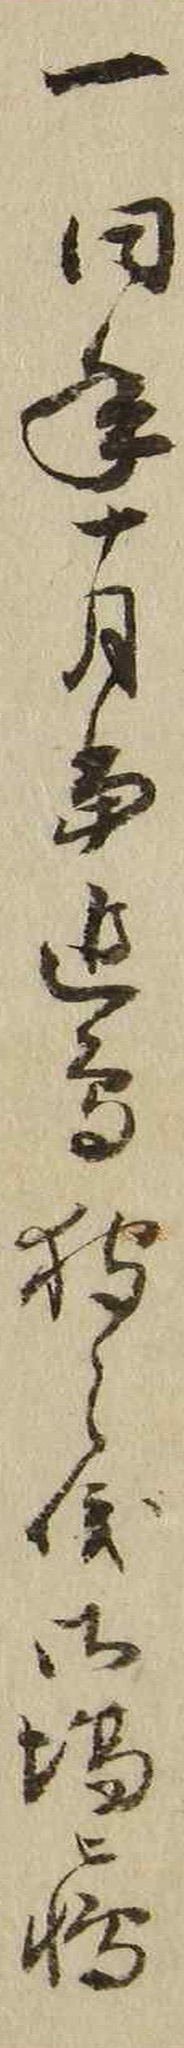一同年十月当追鳥狩之儀御場被転
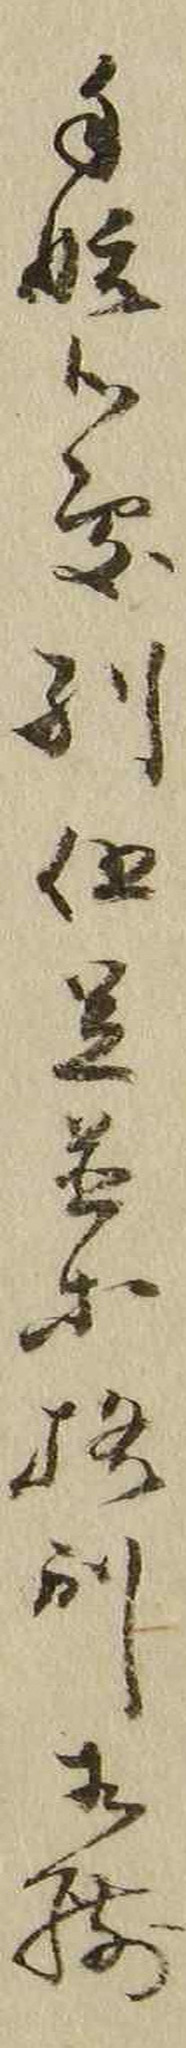手始候処列伍足並等格別相揃
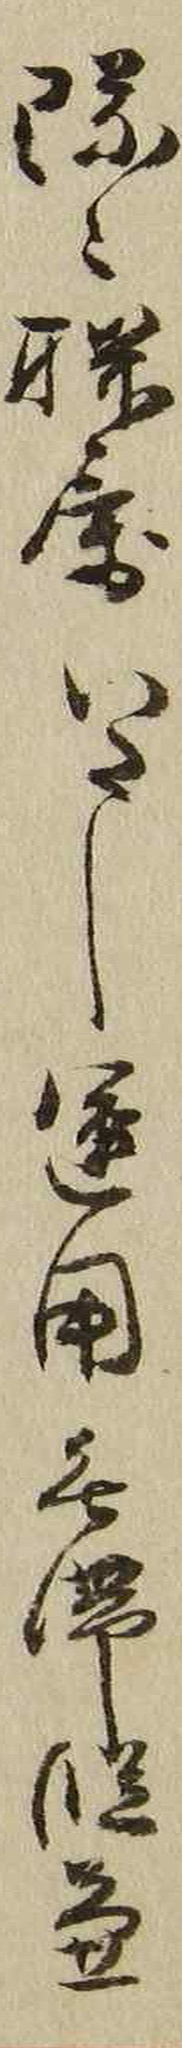隊々聯属いたし運用無滞段兼
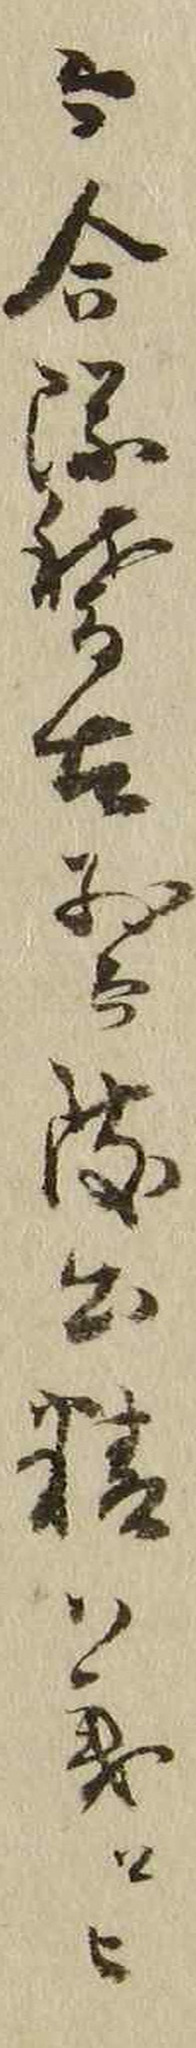而合隊稽古別而致出精候義と被
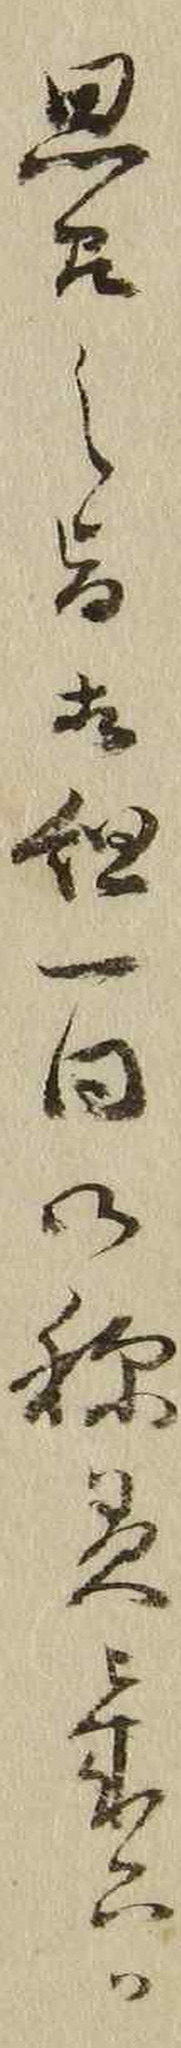思召之旨相組一同御称美被成下候
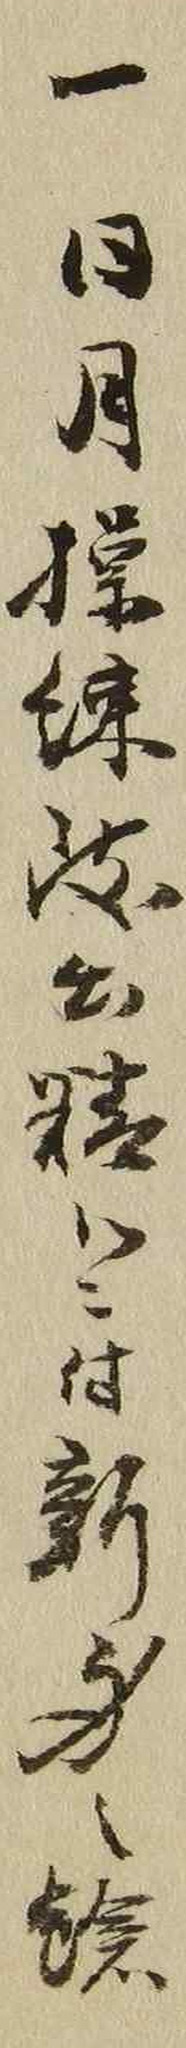一同月操錬致出精候ニ付新身之鎗
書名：諸士系譜　巻之232　け之部1
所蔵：会津若松市立会津図書館
